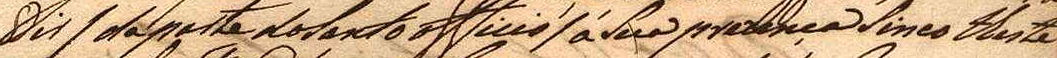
Vir / da parte do Santo officio / á sua prezença sinco theste
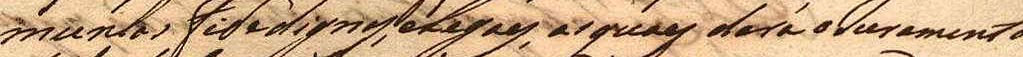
munhas fidedignas, e legaes, as quaes dará o Iuramento
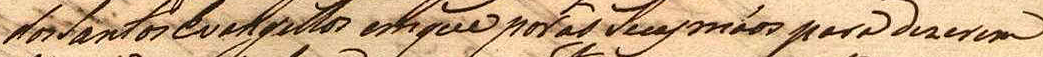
dos santos Evangelhos em que porão suas mãos para dezerem
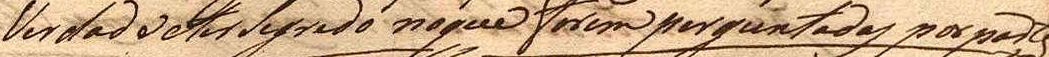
Verdade e ter segredo no que forem perguntadas por parte
